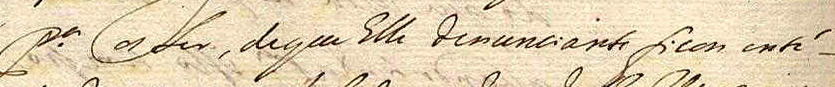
p.a os Ler, de que Elle denunciante ficou entē
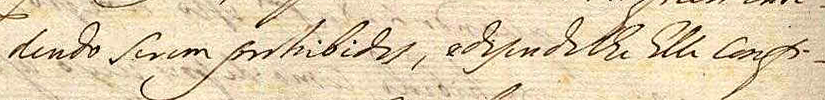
dendo serem prohibidos, e disendolhe Elle confi
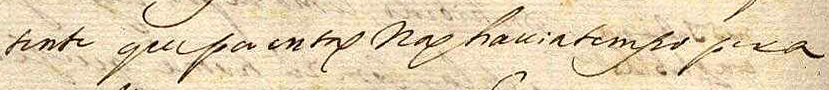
tente que por entaõ naõ hauia tempo pera
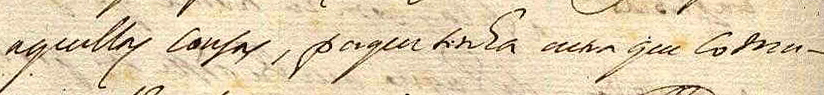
aquellas cousas, porque tinha outra que comu
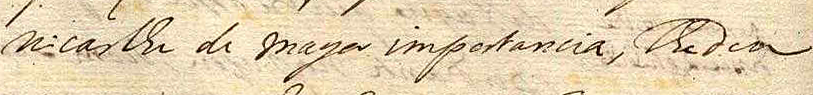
nicarlhe de mayor importancia, lhe deu
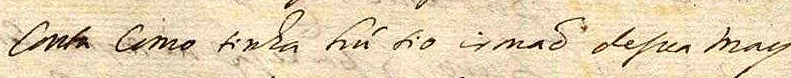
Conta como tinha hū tio irmaõ de sua may
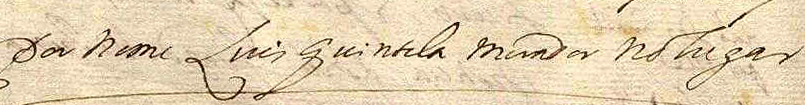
por nome Luis quintela morador no lugar
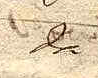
da
